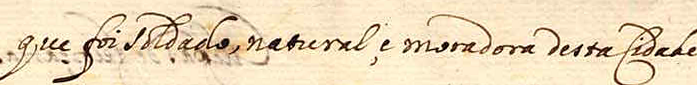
que foi soldado, natural, e moradora desta Cidade
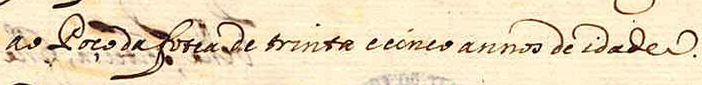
ao Poço da fosea de trinta e cinco annos de idade.
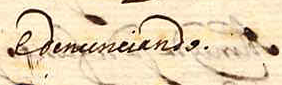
E denunciando.
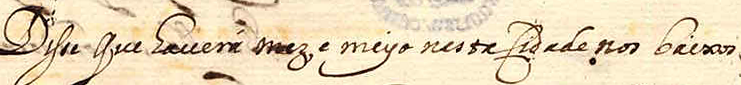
Disse que hauera mez e meyo nesta Cidade nos baixos
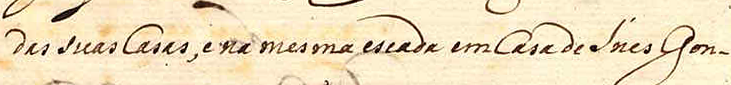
das suas Casas, e na mesma escada em Casa de Ines Gon
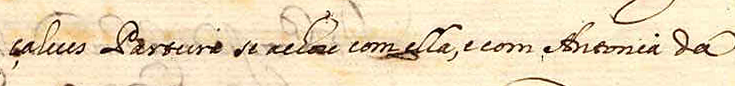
çalues Parteiro se achou com ella, e com Antonia da
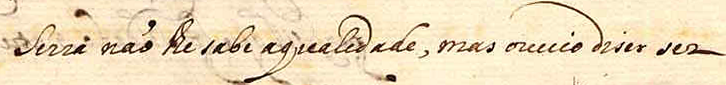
Serra naõ lhe sabe a qualidade, mas ouuio diser ser
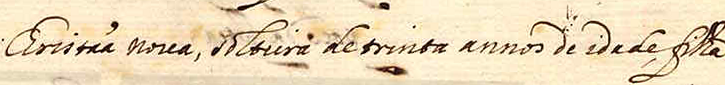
Christaã nova, solteira de trinta annos de idade, filha
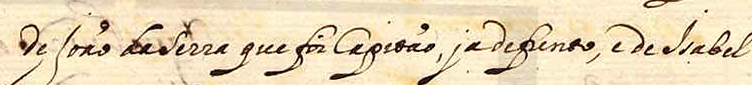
de João da Serra que foi Capitão, já defunto, e de Isabel
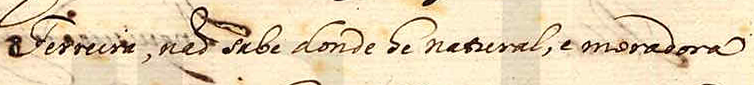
Ferreira, naõ sabe donde he natural, e moradora
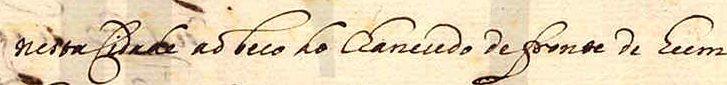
nesta Cidade ao beco do Chancudo defronte de hum
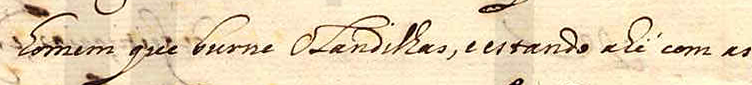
homem que burne O Landilhas, e estando ahi com as
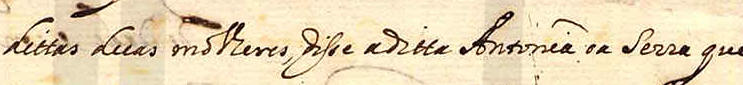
dittas duas molheres, disse a ditta Antonia da Serra que
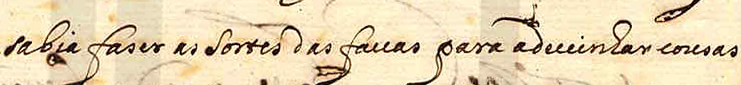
sabia fazer as sortes das fauas para adeuinhar cousas
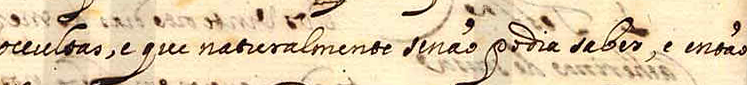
occultas, e que naturalmente se não podia saber, e então
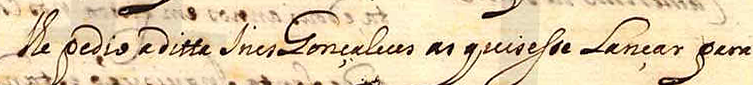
lhe pedio a ditta Ines Gonçalves as quisesse lançar para
